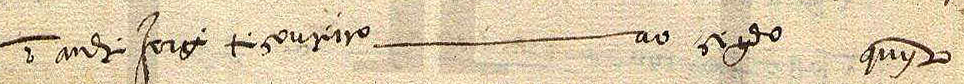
item andre Jorge tesoureiro – ao segdo qūyto
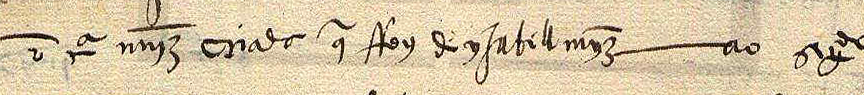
item ca nn̄jz criada q̄ ffoy de yJabell mȳz– ao segdo
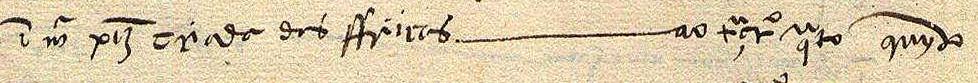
item ma p̄iz criada das ffreiras – ao t̄cro q̄to q̄uyto
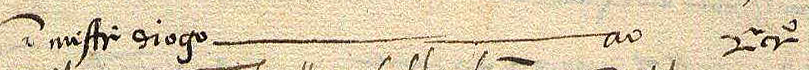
item mestre diogo – ao t̄cro
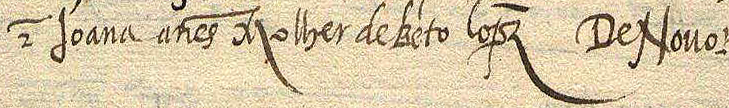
item Joana anes Molher de Bēto lop̄z De Nouo
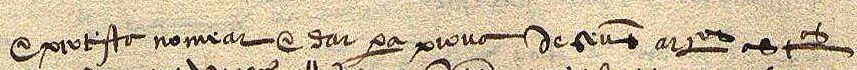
e protesta nomear e dar ꝑa proua de seus artos as tas
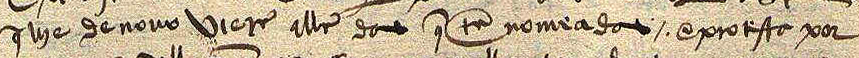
q̄ lhe de nouo vierē allē das q̄ tē nomeadas /. e protesta por
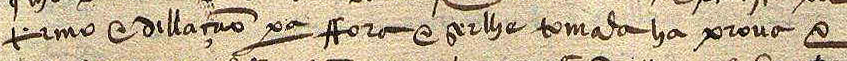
termo e dillação ꝑa ffora e ser lhe tomada ha proua e
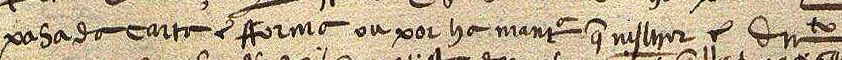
pasada carta ē fforma ou por ha manra q̄ mJlhor ē drrto
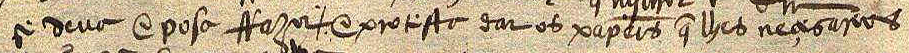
se deua e posa ffazer / e protesta dar os papeis q̄ lhes necesarios
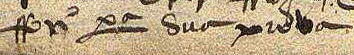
fforē ꝑa Sua prova
